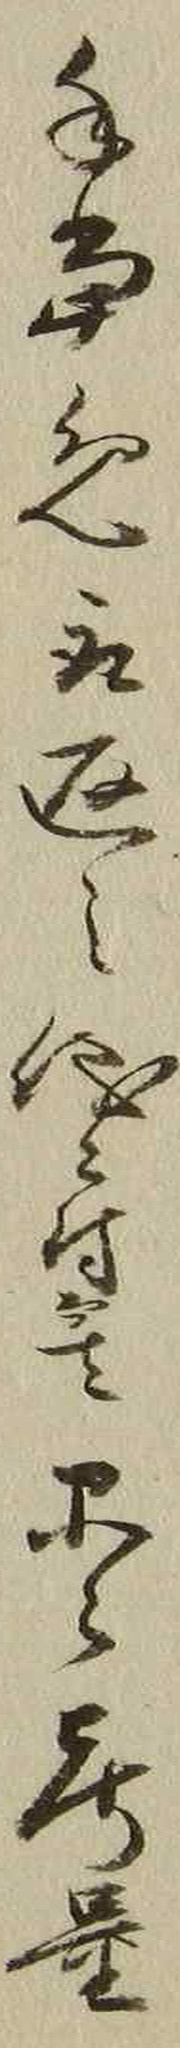手当免取返之儀ニ付而は品々考量
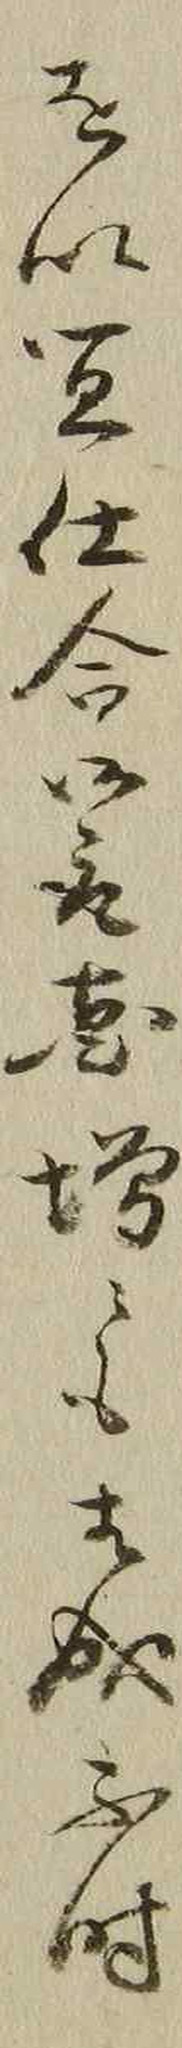を以宜仕合御取固増ニも相成不時
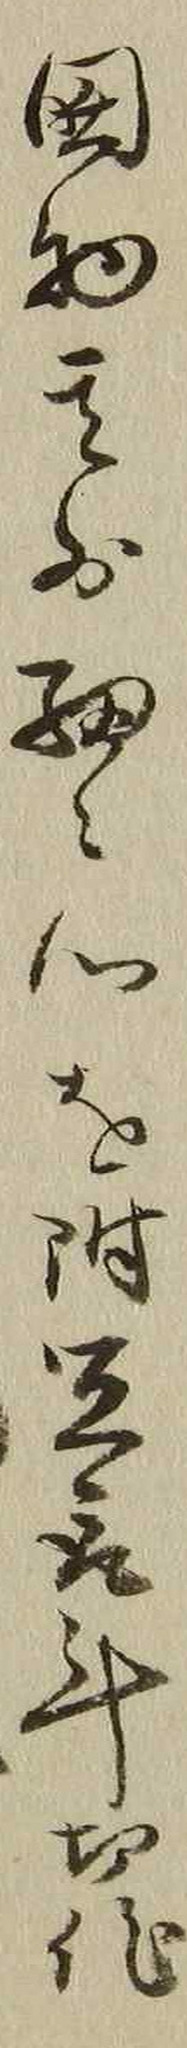囲物其外細々心を附宜取計切作
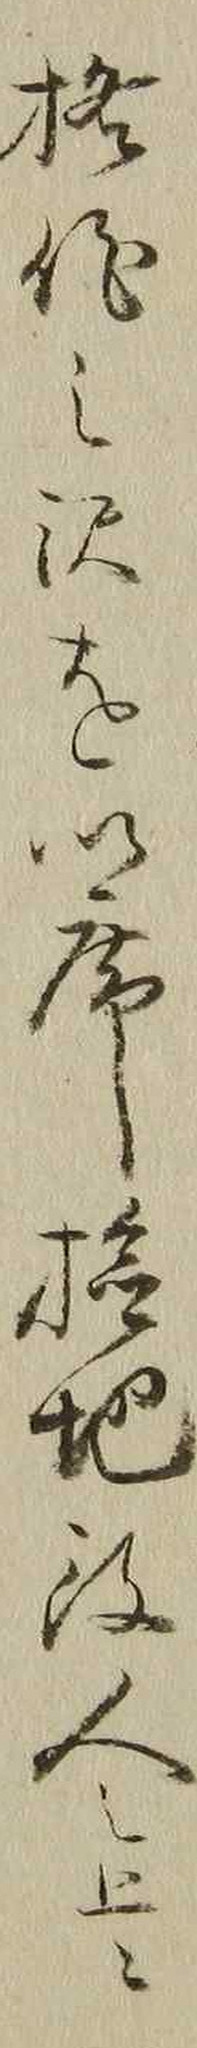格作之訳を以席之検地役人之上ニ
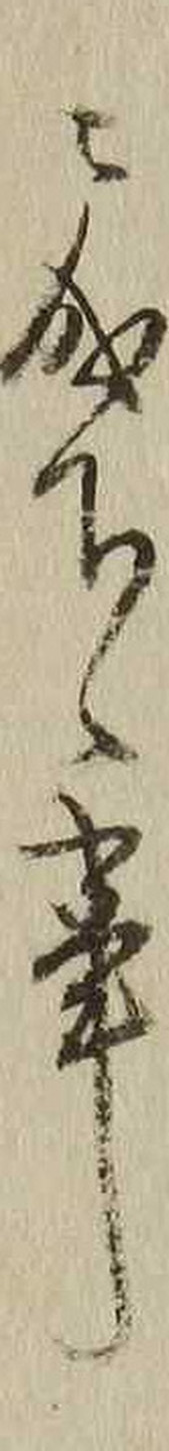被成下候事
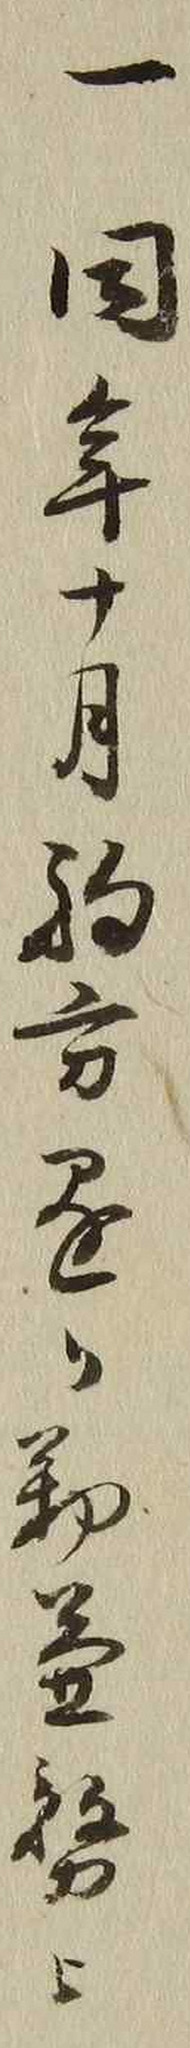一同年十月駒方懸り勤兼務被
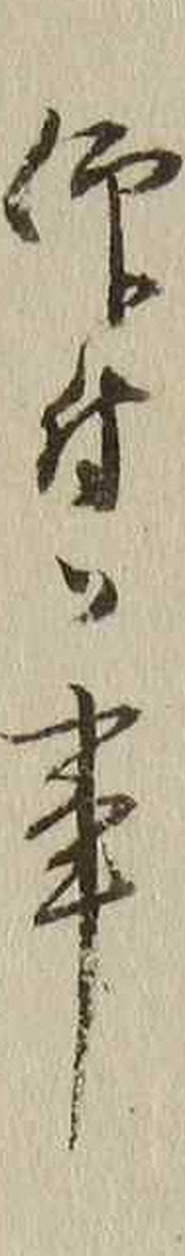仰付候事
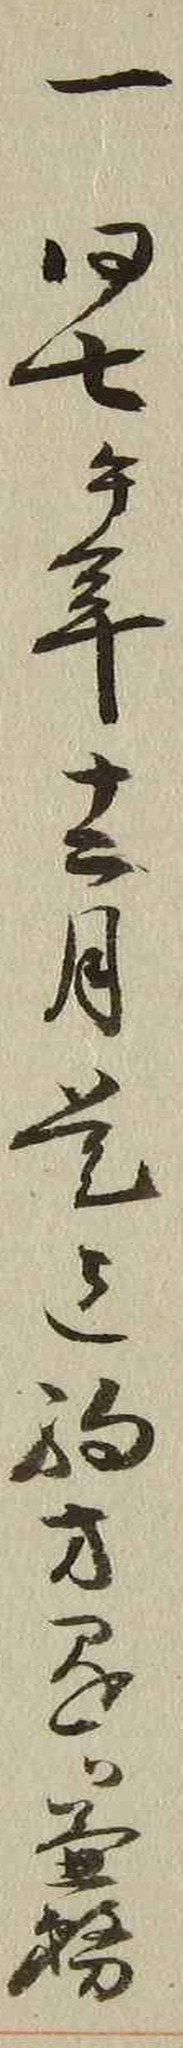一同七午年十二月是迄駒方懸り兼務
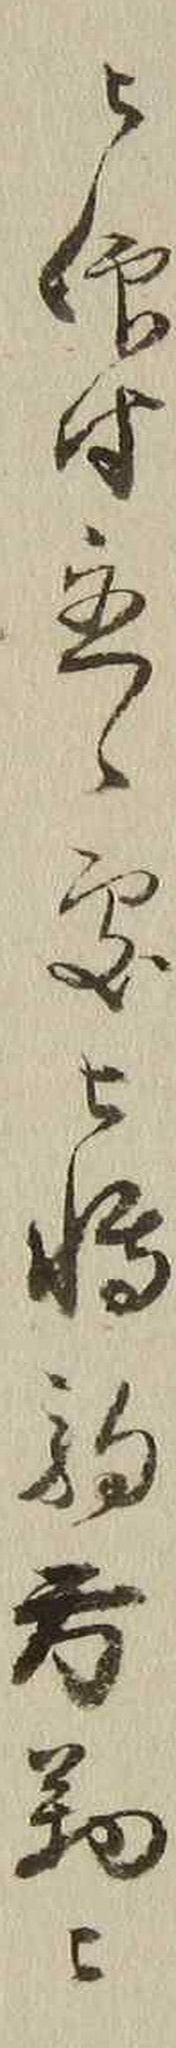被仰付置候処被転駒方勤被
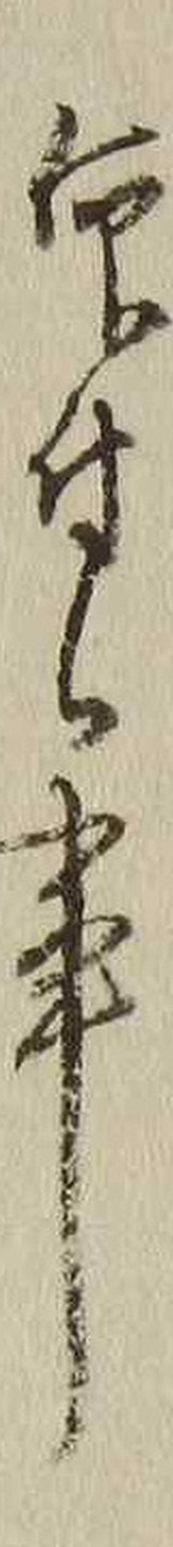仰付候事
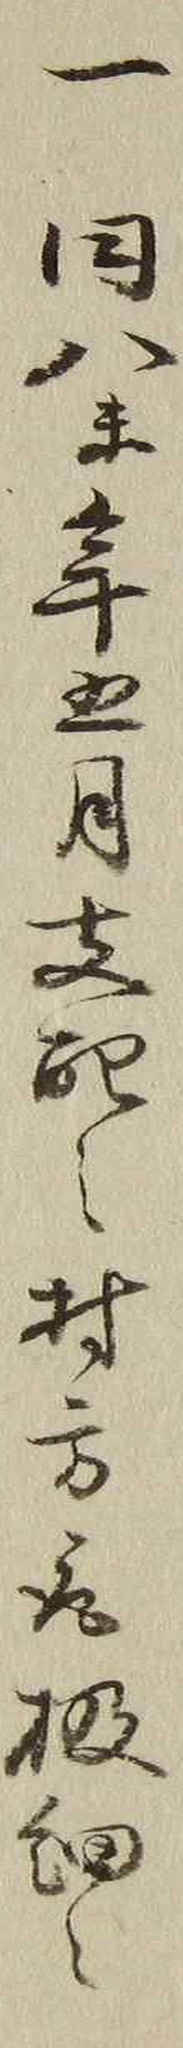一同八未年五月支配之村方取扱細々
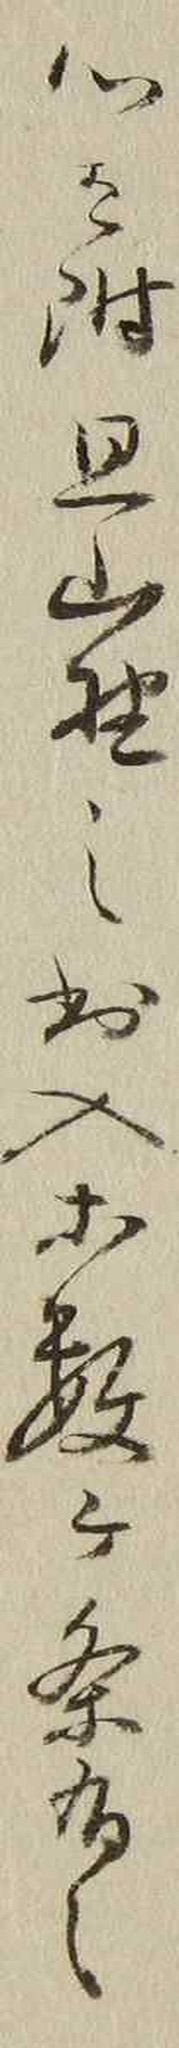心を附且山野之出入等数ヶ条有之
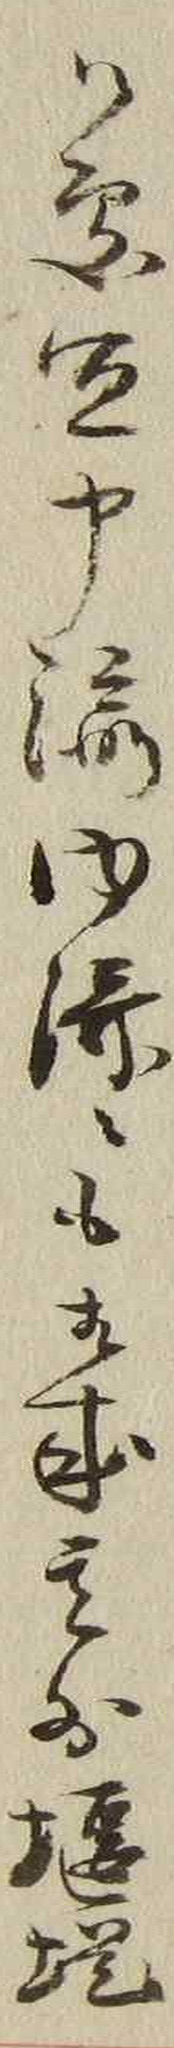候処宜申諭内済ニも相成其外堰堤
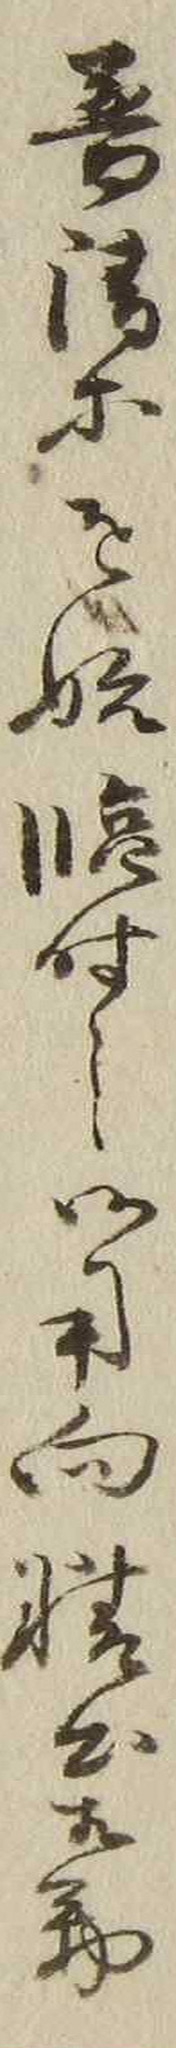普請等を始臨時之御用向精出相勤
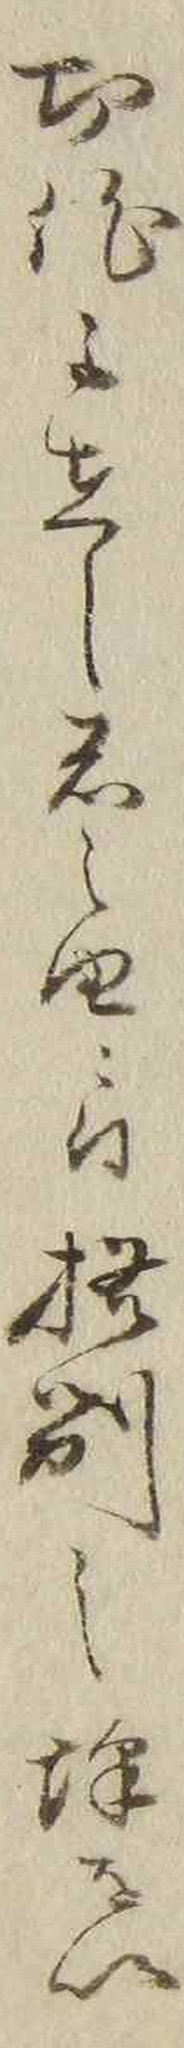切作に在之者之由ニ付格別之訳を以

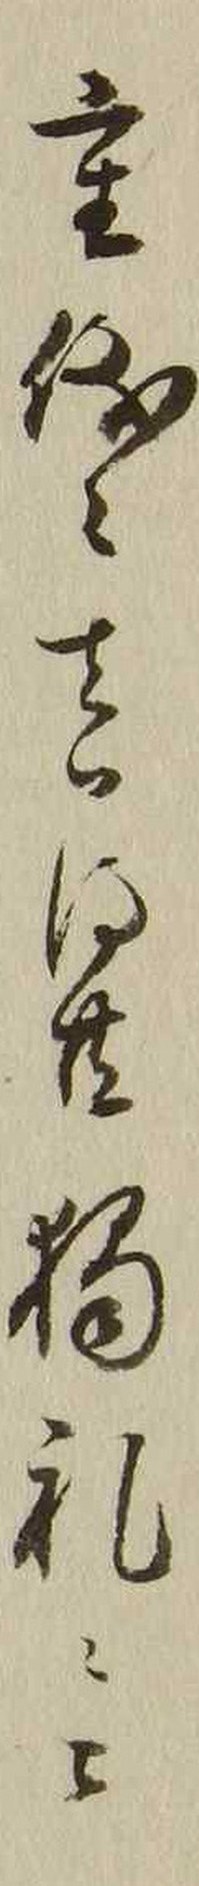重儀ニ者候得共独礼ニ被
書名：諸士系譜　巻之236　ふ之部4
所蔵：会津若松市立会津図書館
